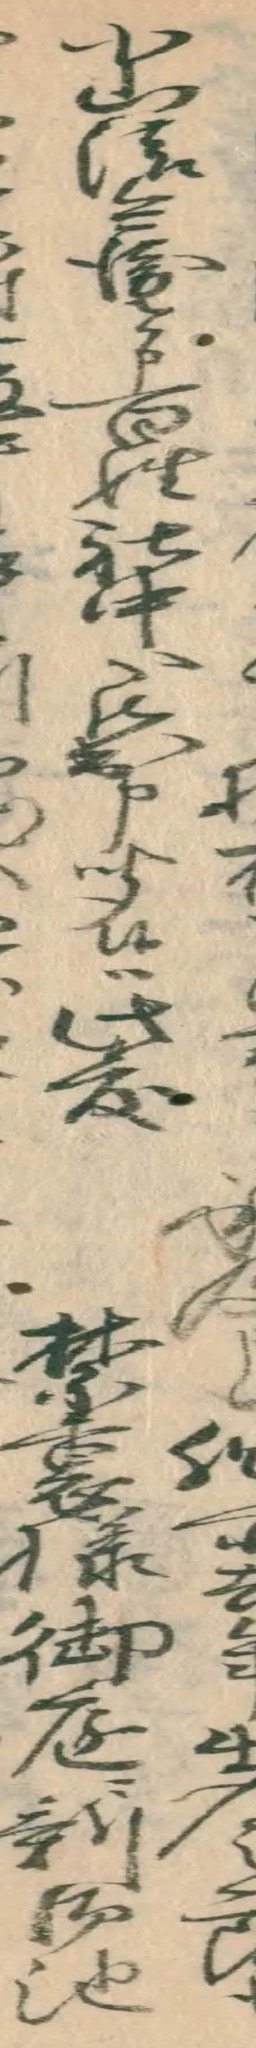小山清兵衛と申百姓社中へ罷出申聞候ハ此度禁裏様御庭ニ新御池
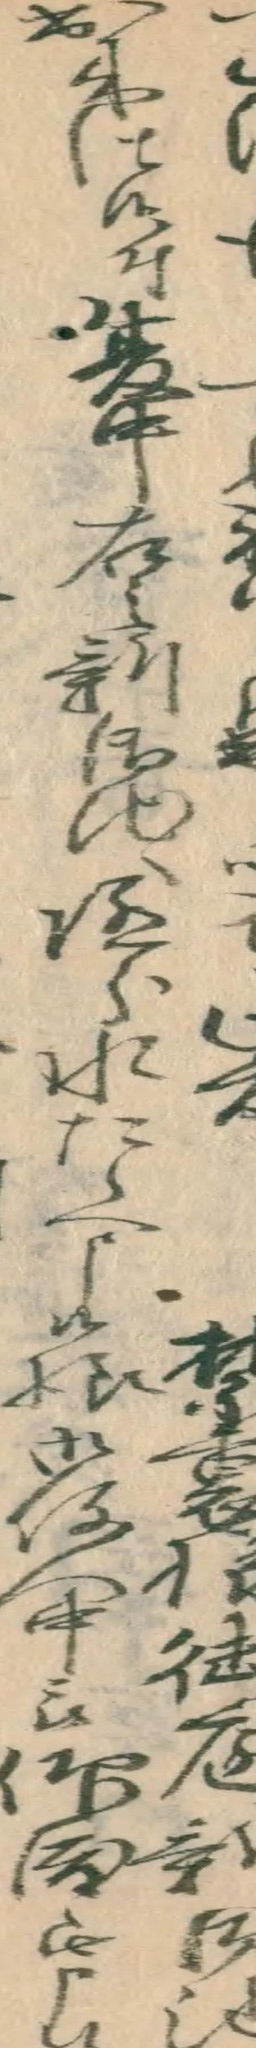出来仕候ニ付夏中右之新御池へ随分水たゝへ申候様御役人中被仰渡被申候
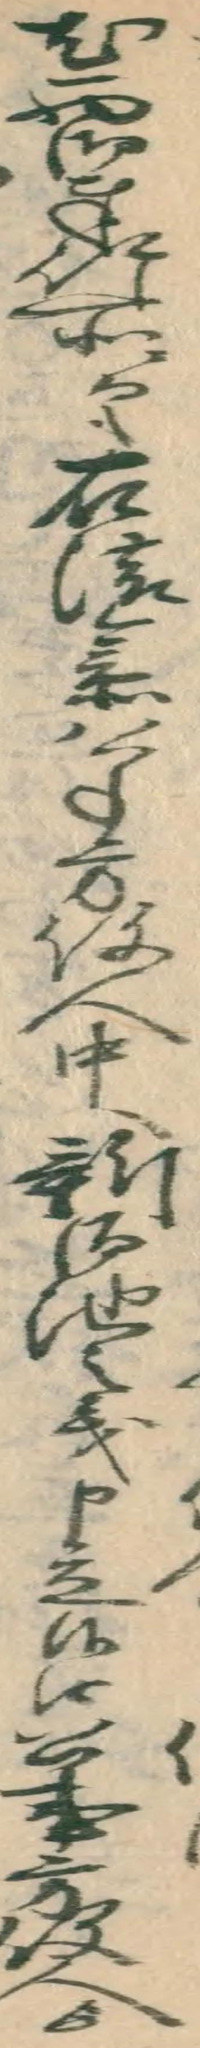尤西御奉行所ニ而も右清兵衛公事方役人中へ新御池之義申立候由公事方役人ゟ
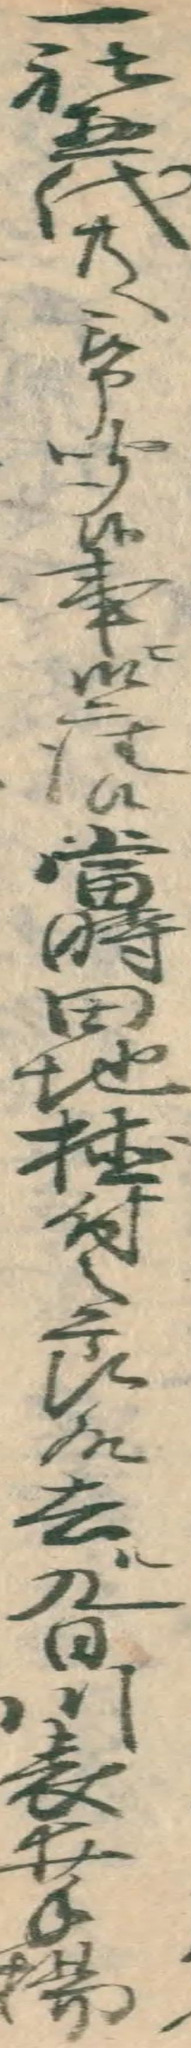一社惣代共へ被申聞候事ニ御座候当時田地植付之節故去ル九日川表井手揚
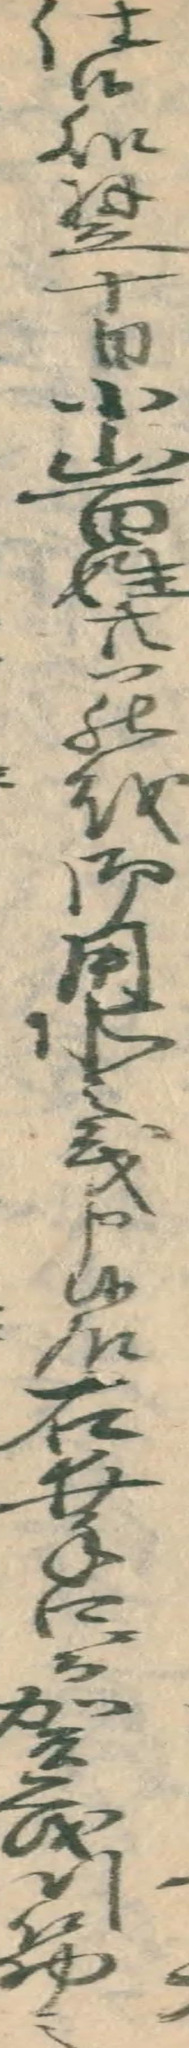仕候処翌十日小山百姓共罷越御用水之義申候故右井手口ニ而賀茂川筋之
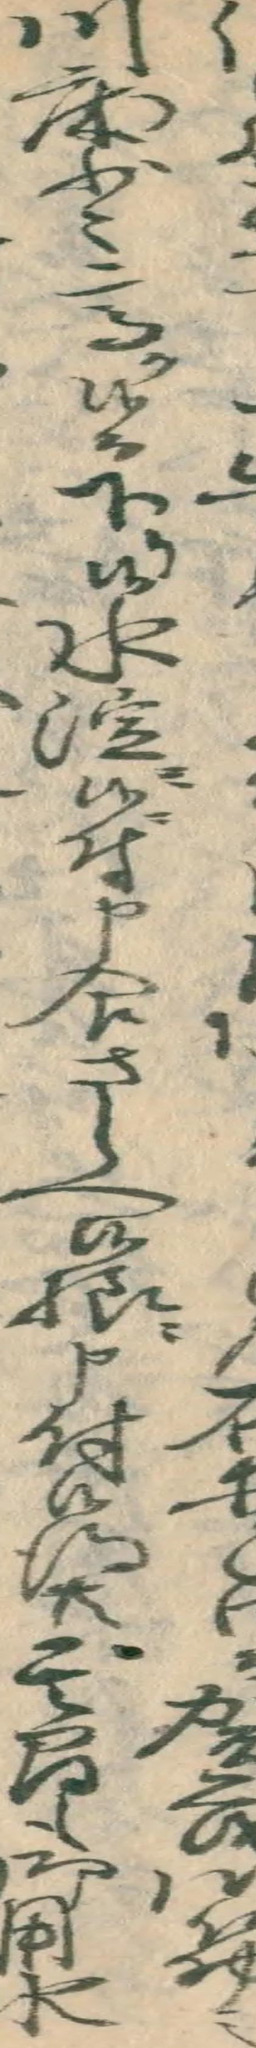川床少々高ク候而下り候水淀ミ候ニ付申合さらへ候様ニ申付候得共其間も御用水
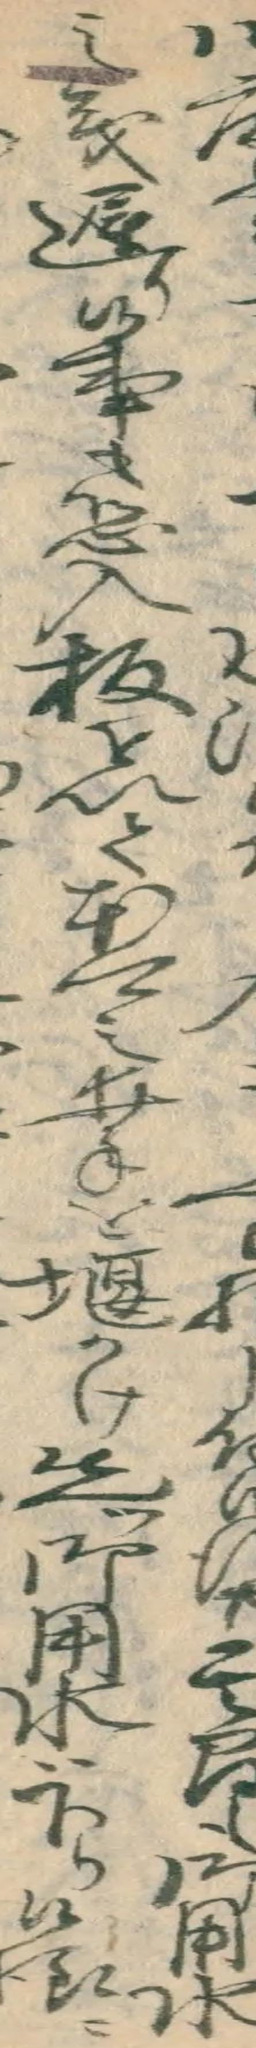之義遅り候事も恐入板を以て本郷之井手を堰かけ先ツ御用水ハ下り候様ニ
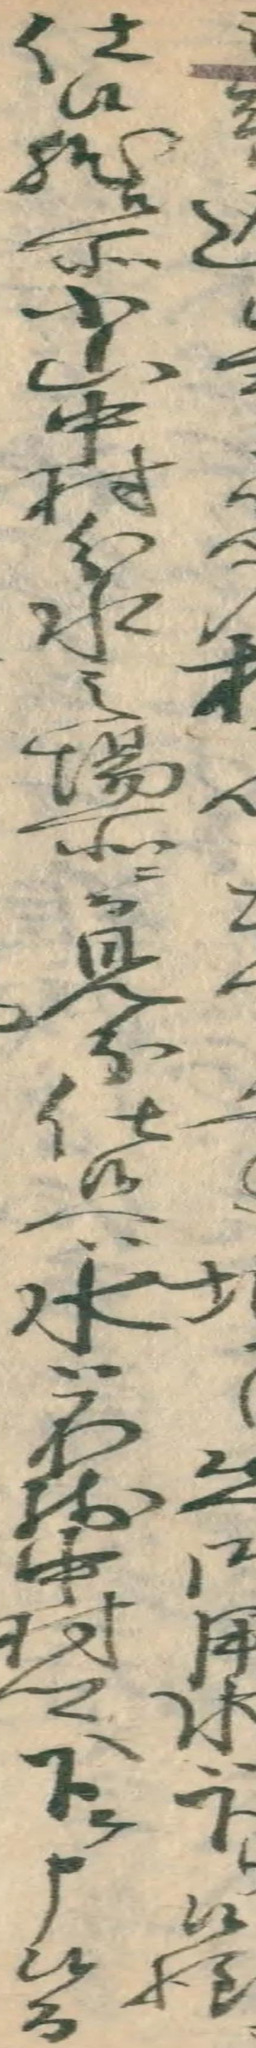仕候然ル所小山中村分水之場所ニ而見分仕候へハ水ハ不残中村郷へ下ケ申候而
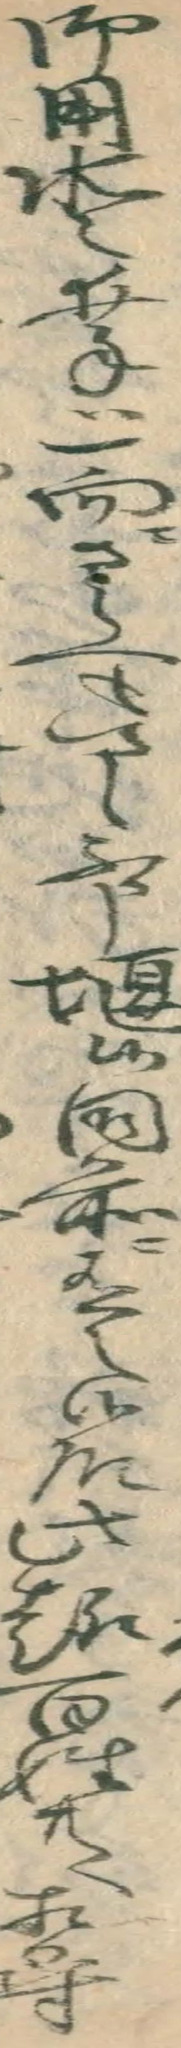御用水之井手ハ一向ニさらへもいたし不申堰候同前ニ有之候故此趣百姓共へ相尋
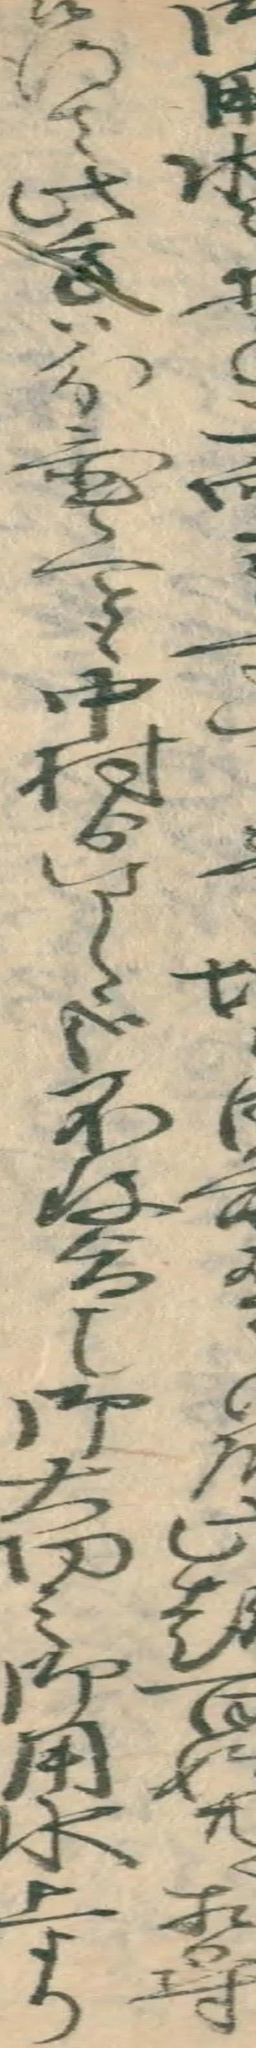候得者此方ハ分置候へとも中村ゟいたし候哉不存旨申候御大切之御用水上より
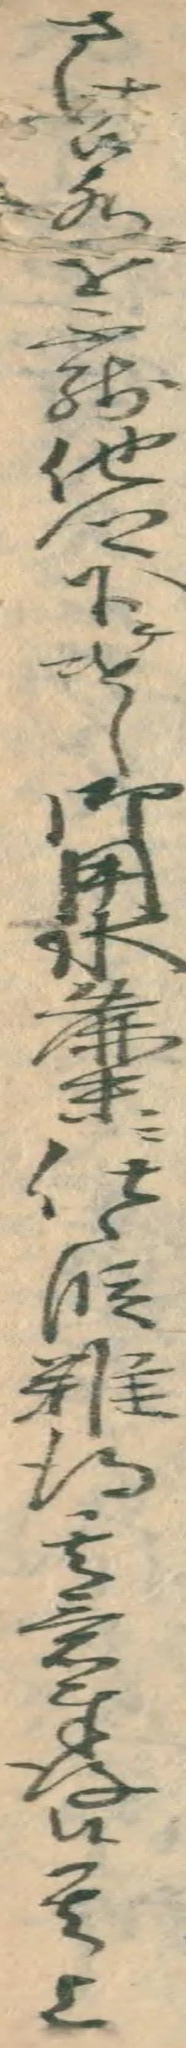さけ候水を不残他郷へ下ケ遣し御用水麁末ニ仕候段難得其意奉存候其上

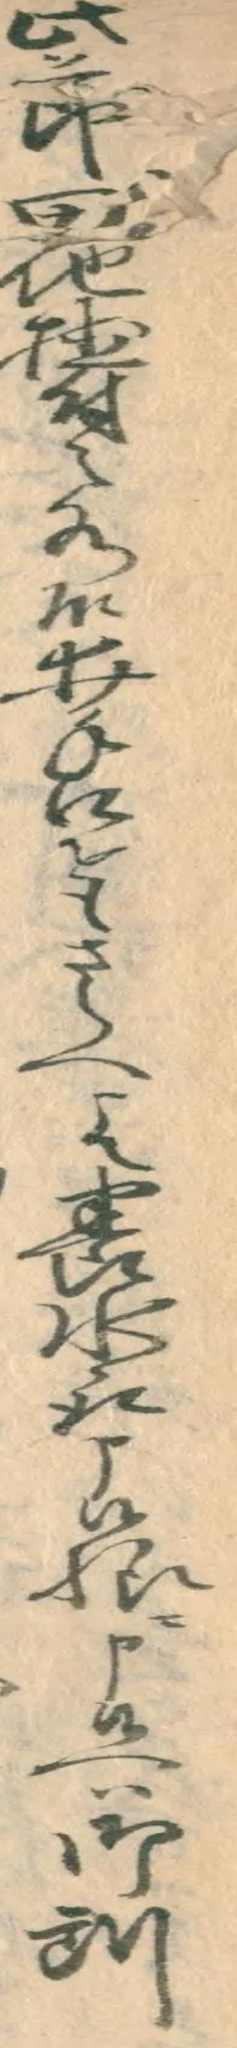此節田地植付之水故井手口をもさらへ候て養水取申候様ニ申候へハ御所
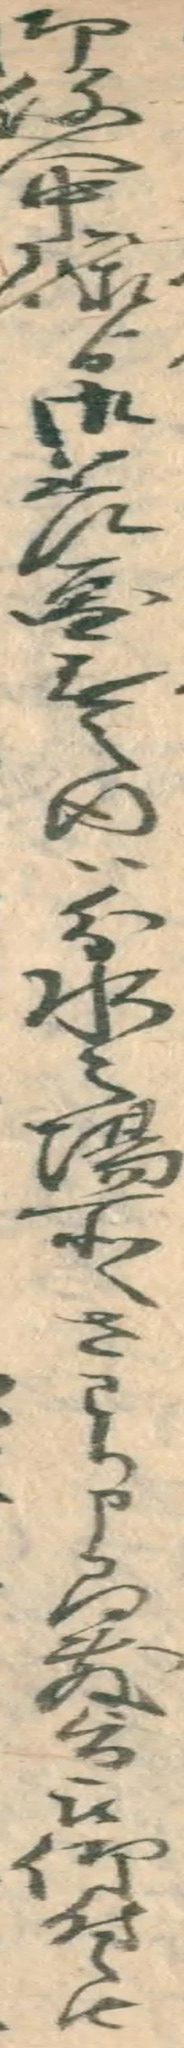御役人中様ゟ御差図無之内ハ分水之場所へさわり申間敷旨被仰付候由
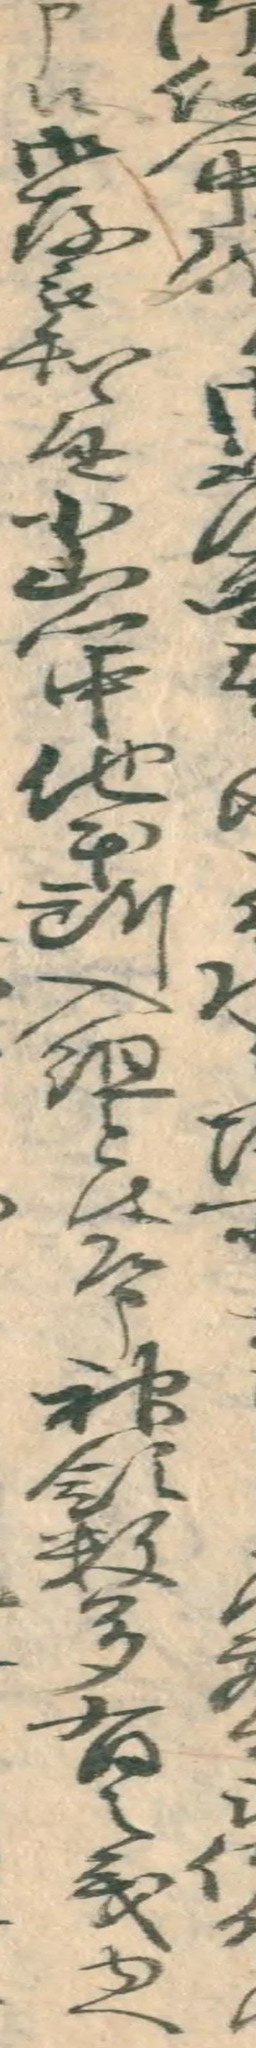申候御存被知候通小山郷中他本所入組とは乍申神領数多有之義ゆへ
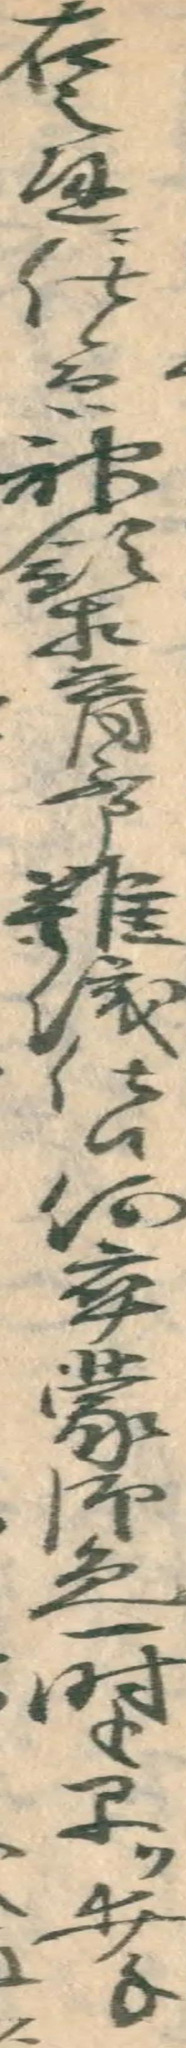右之通ニ仕候而ハ神領相育不申難儀仕候何卒蒙御免一時も早ク井手
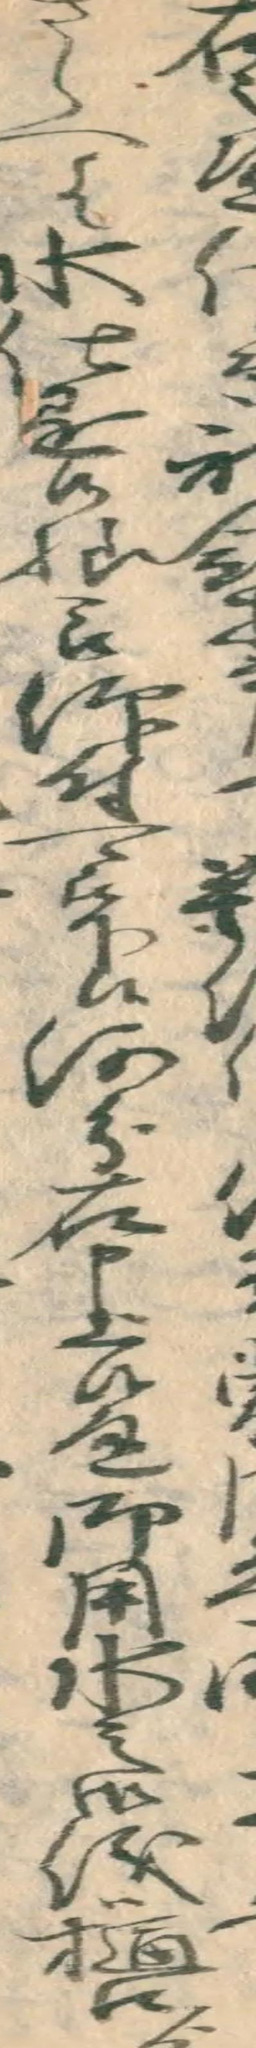さらへ候て水仕懸候様被仰付可被下候何分右申上候通御用水之御儀ハ樋口ゟ
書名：賀茂社記録. 第58冊
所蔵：国立国会図書館 National Diet Library, JAPAN
